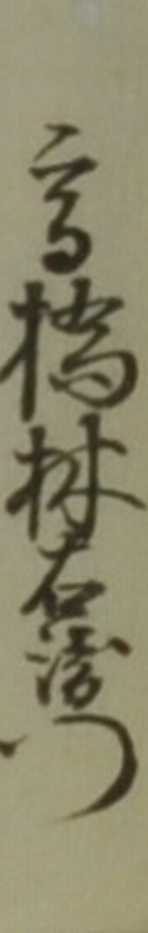高橋林右衛門
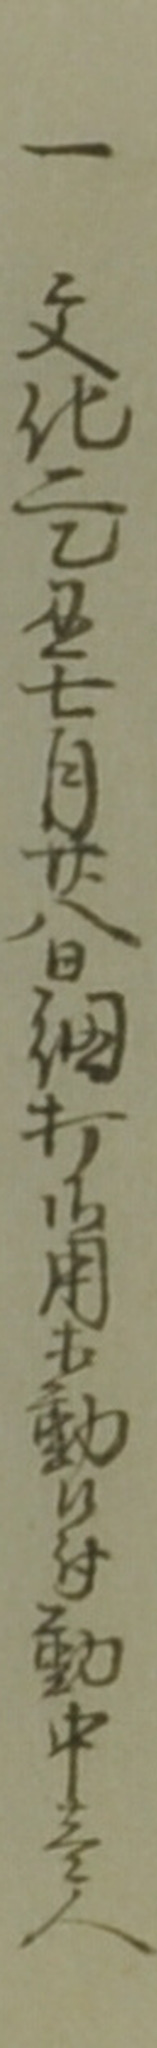一文化二乙丑七月廿八日網打御用相勤候付勤中壱人
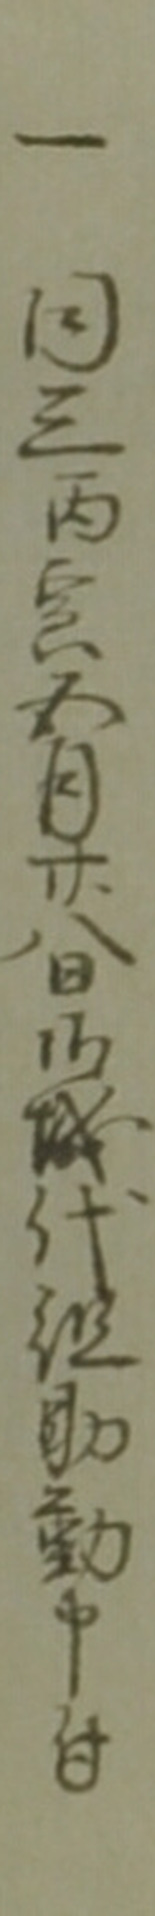一同三丙寅五月廿八日御城代組助勤申付
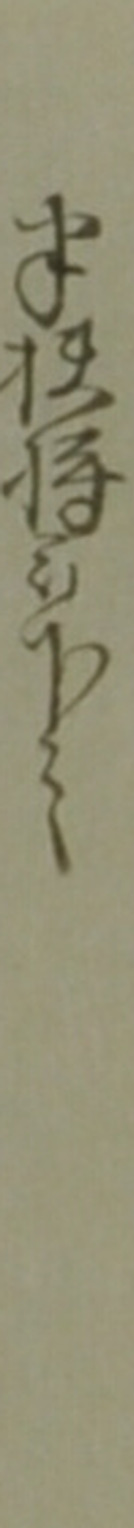半扶持被下之
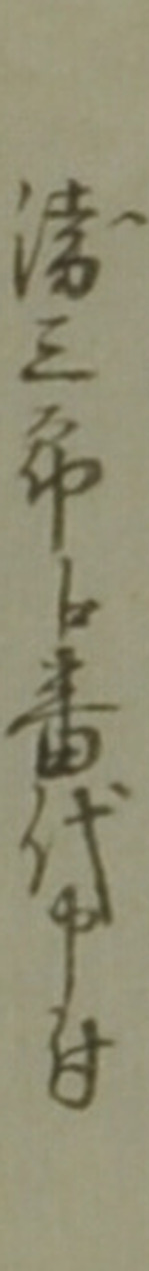清三郎江番代申付
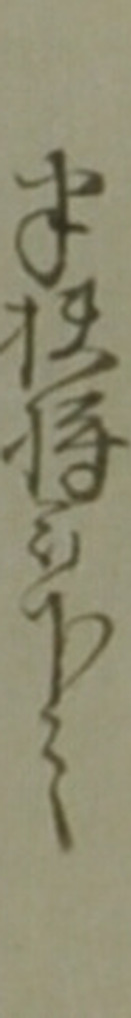半扶持被下之
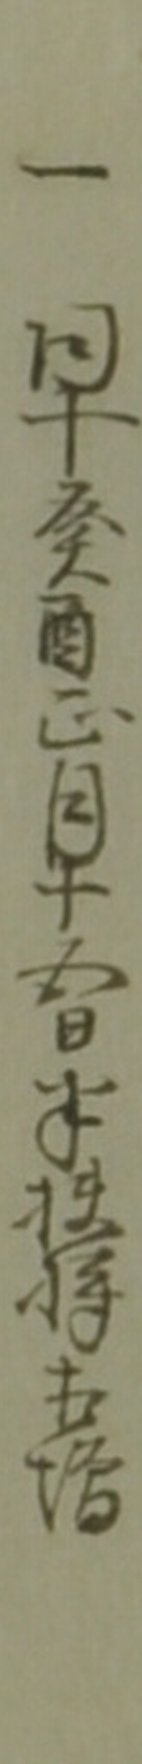一同十癸酉正月十五日半扶持相増
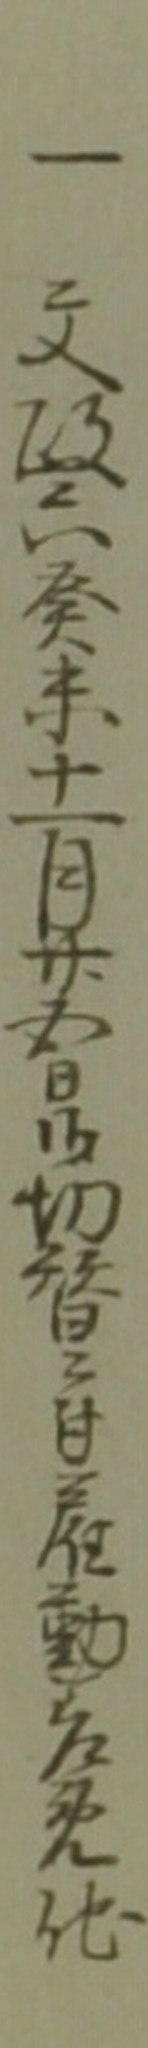一文政六癸未十一月廿五日御切替ニ付雇勤差免他
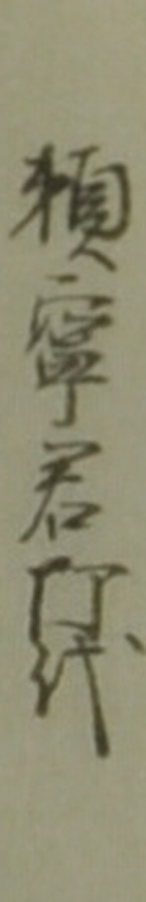頼寧君御代

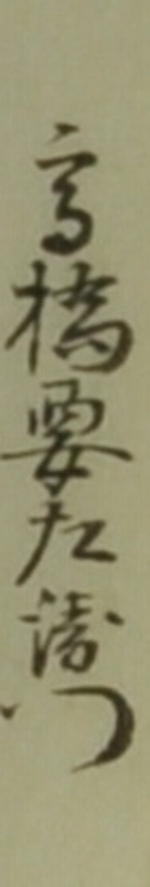髙橋要左衛門
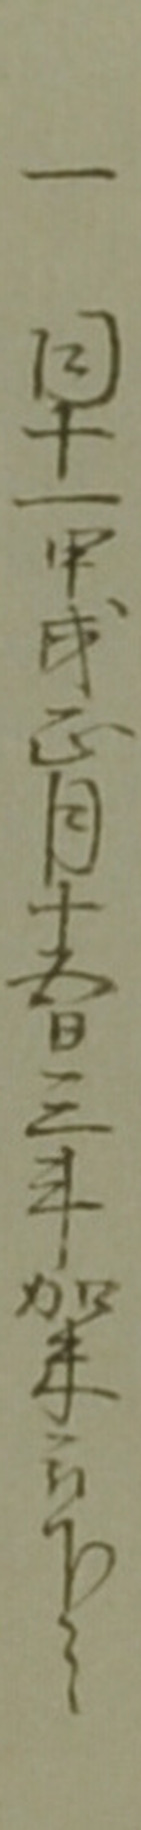一同十一甲戌正月十五日三斗加米被下之
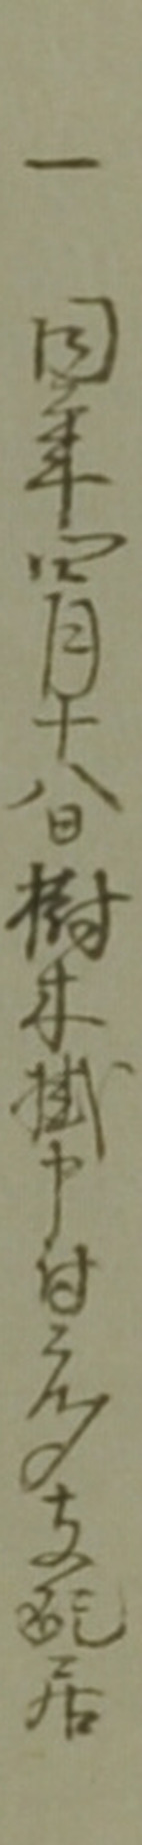一同年四月十八日樹木掛申付元〆支配居
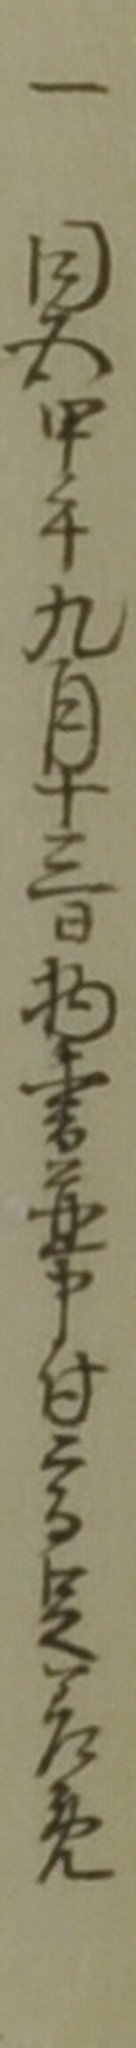一同五甲午九月十三日物書並申付高足差免
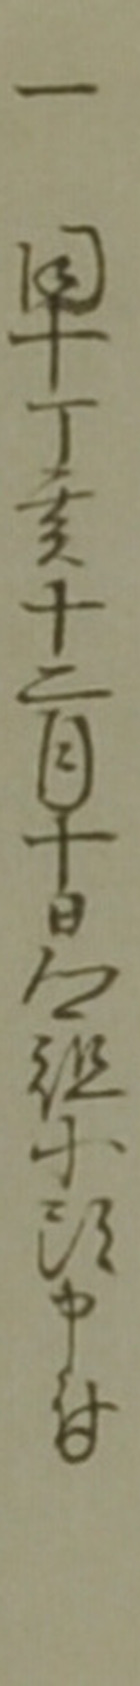一同十丁亥十二月十日郷組小頭申付
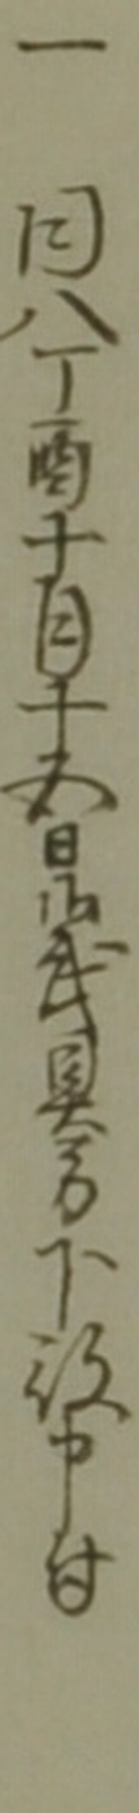一同八丁酉十月十五日御武具方下役申付
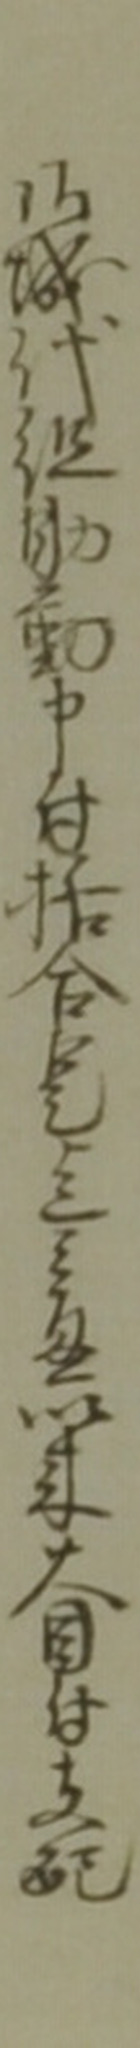御城代組助勤申付格合是迄之通以来大目付支配
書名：無足諸士勤仕録（八）
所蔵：伊那市立高遠町図書館・合同会社AMANE
